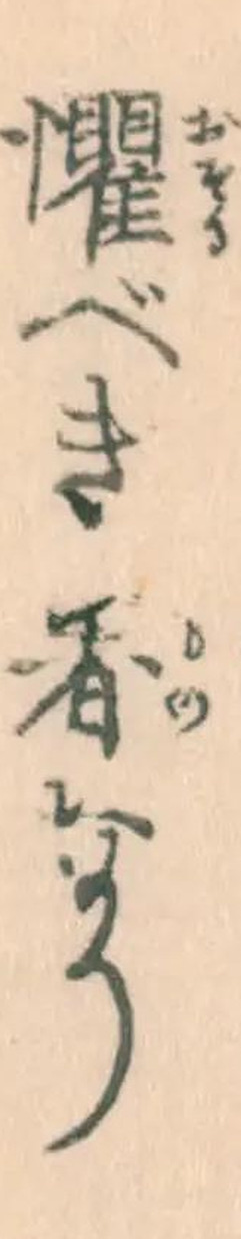懼べき者なり

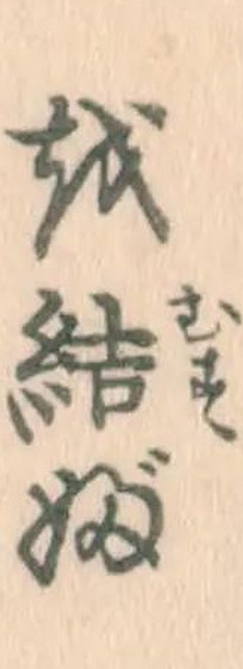を結ぶ

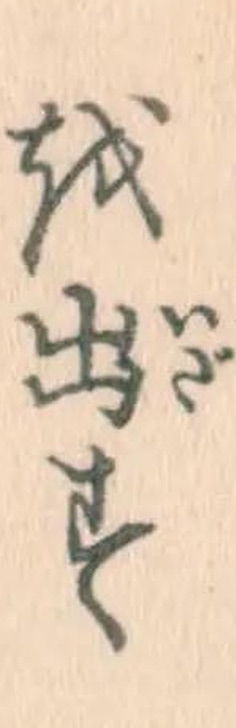を出す

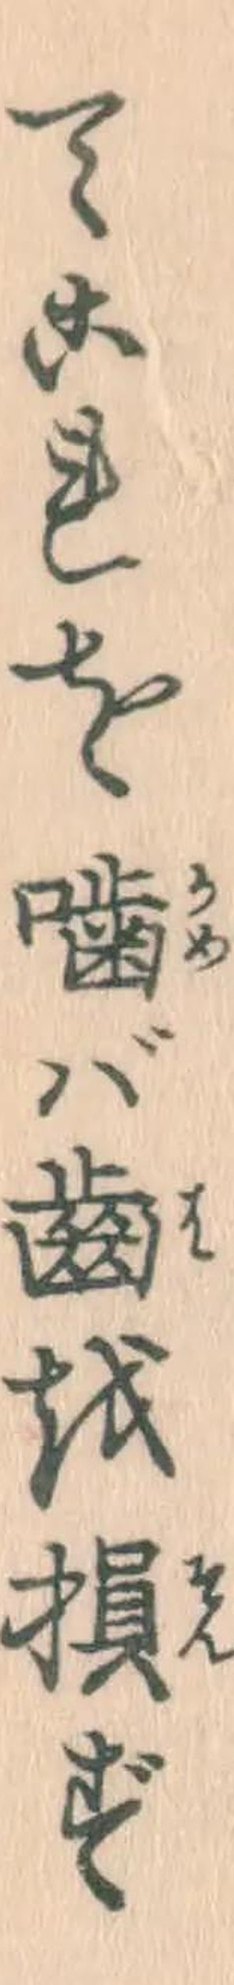てこれを噛ば歯を損ず

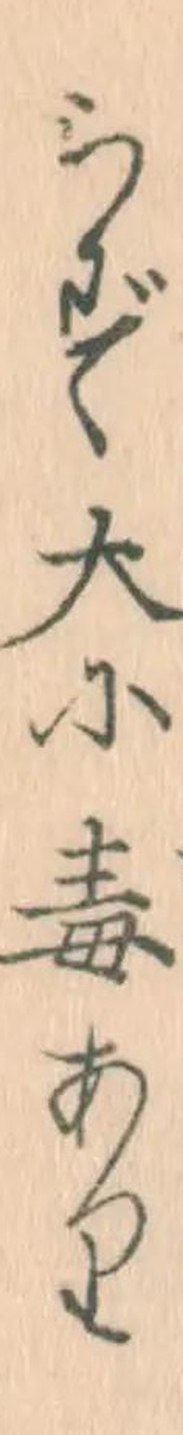らず大に毒あり

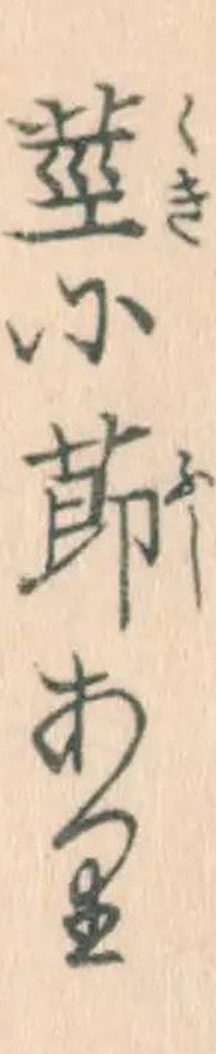茎に節あり

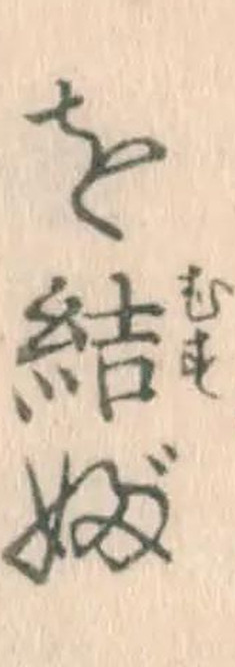を結ぶ

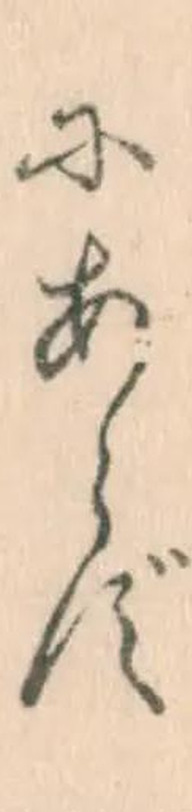にあらず

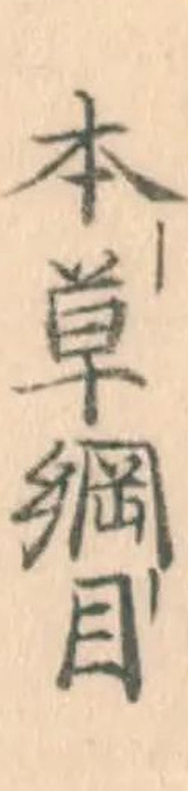本草綱目
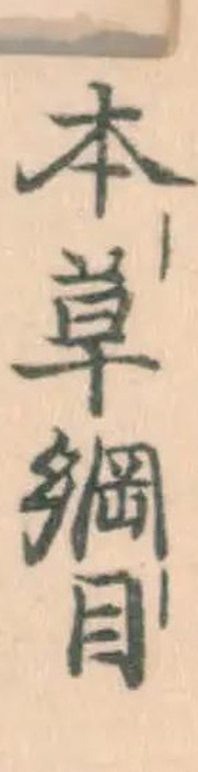本草綱目
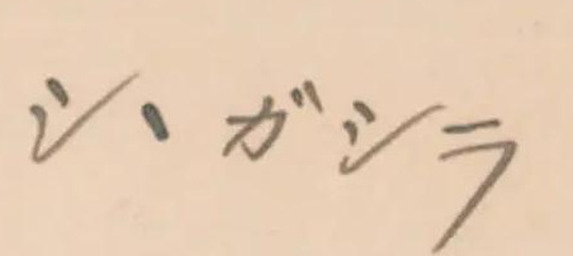シヽガシラ
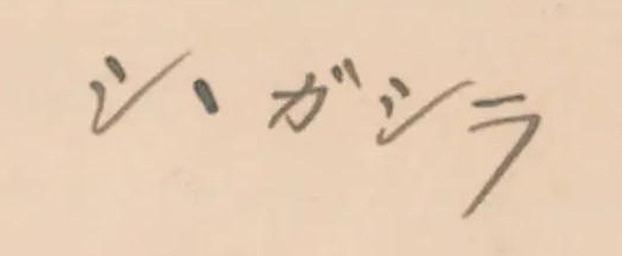シヽガシラ
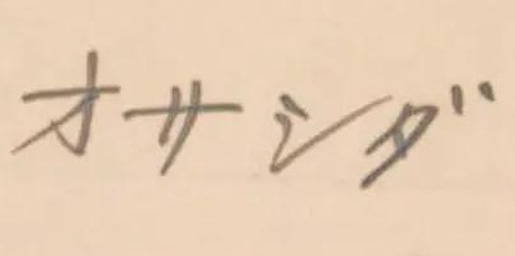オサシダ
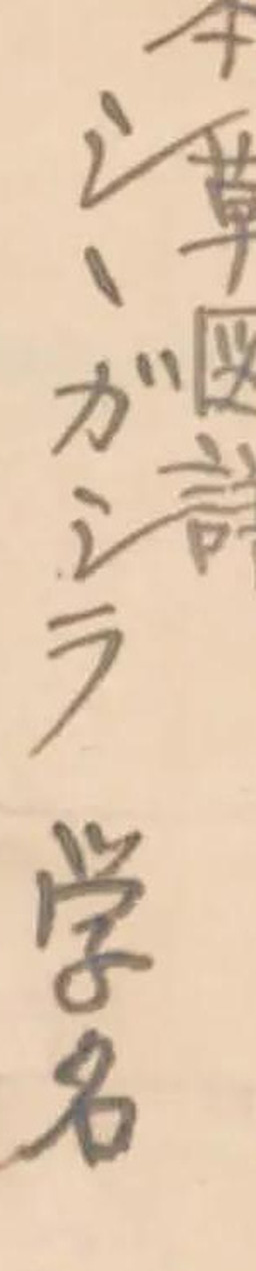シヽガシラ学名

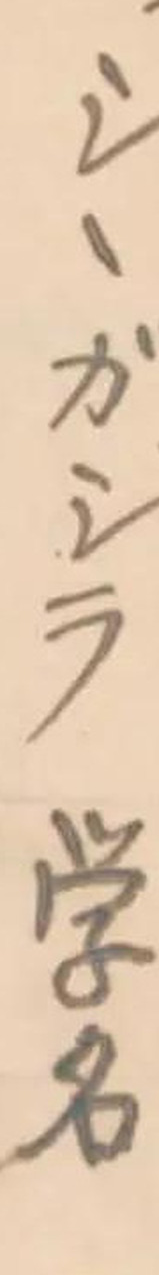シヽガシラ学名

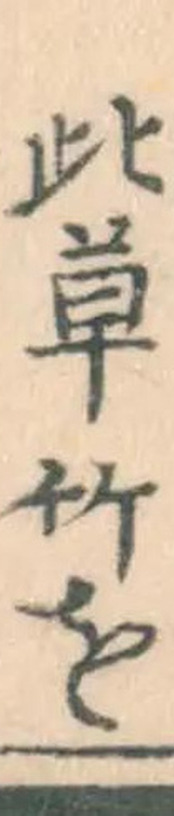此草竹を
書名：有毒草木図説 2巻. [1]
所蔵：国立国会図書館 National Diet Library, JAPAN
